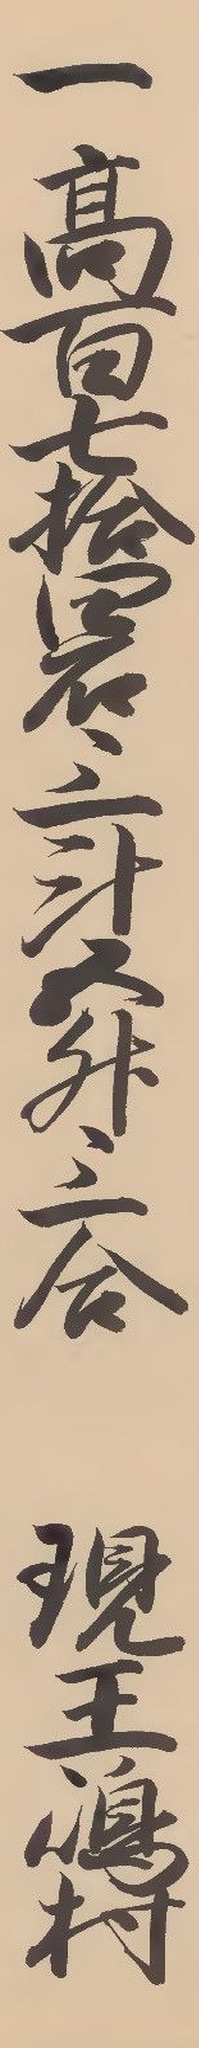一高百七拾四石三斗五升三合現王島村
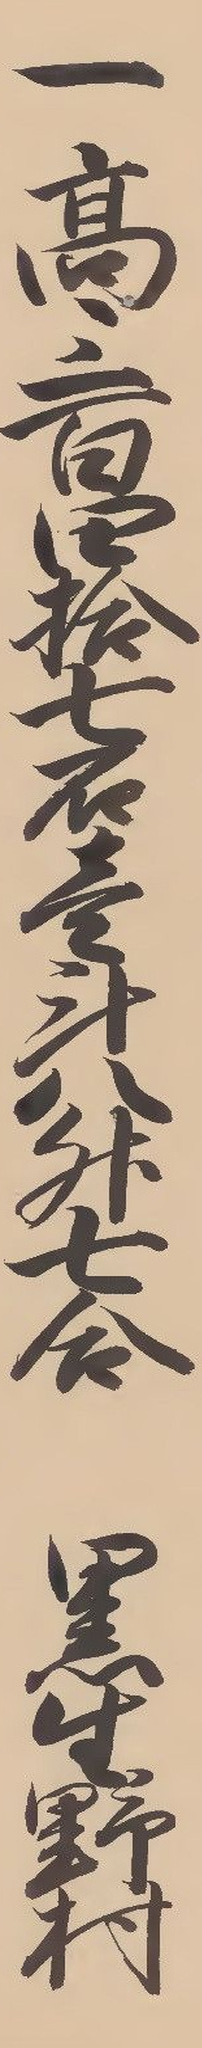一高三百四拾七石壱斗八升七合黒生野村
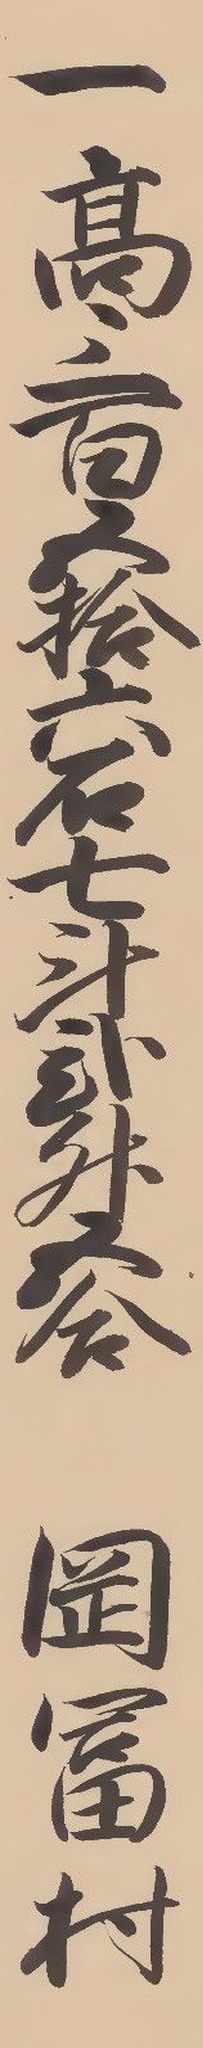一高三百五拾六石七斗弐升五合岡富村
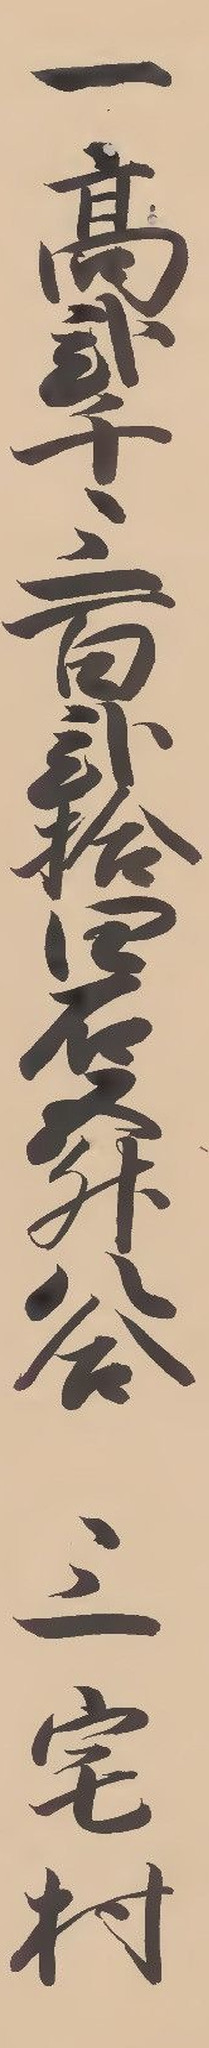一高弐千三百弐拾四石五升八合三宅村
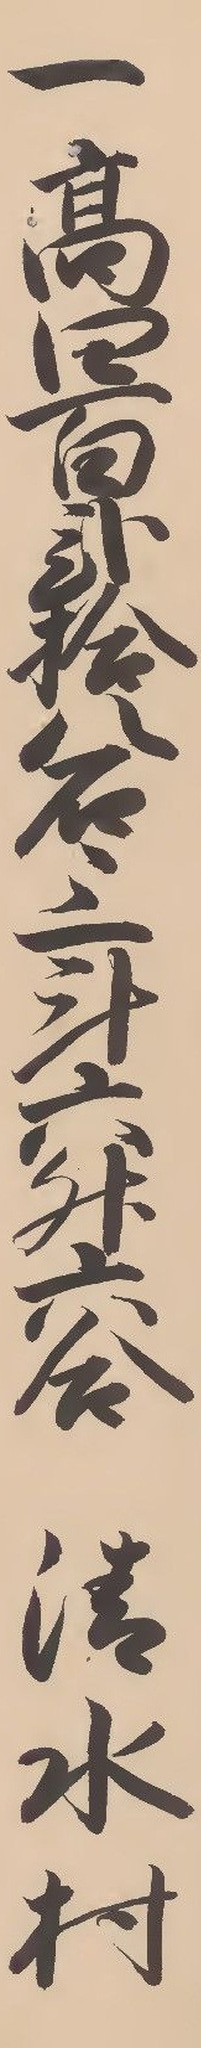一高四百弐拾八石三斗六升六合清水村
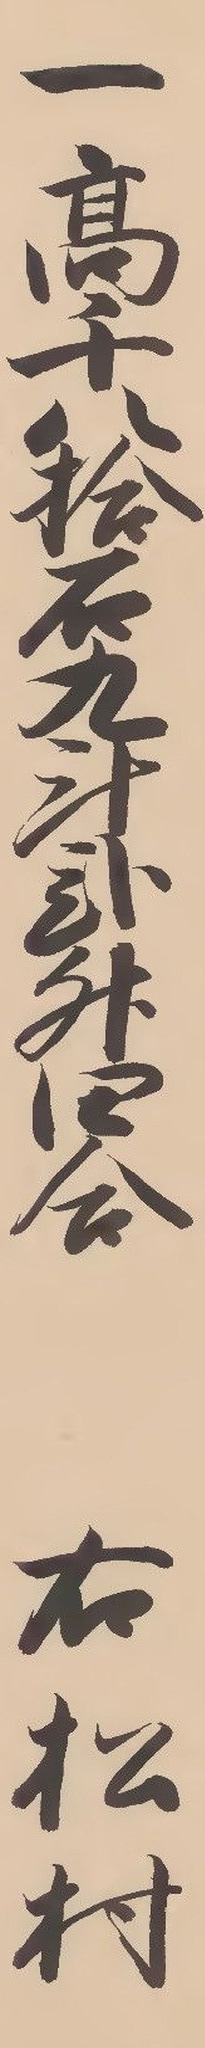一高千八拾石九斗弐升四合右松村
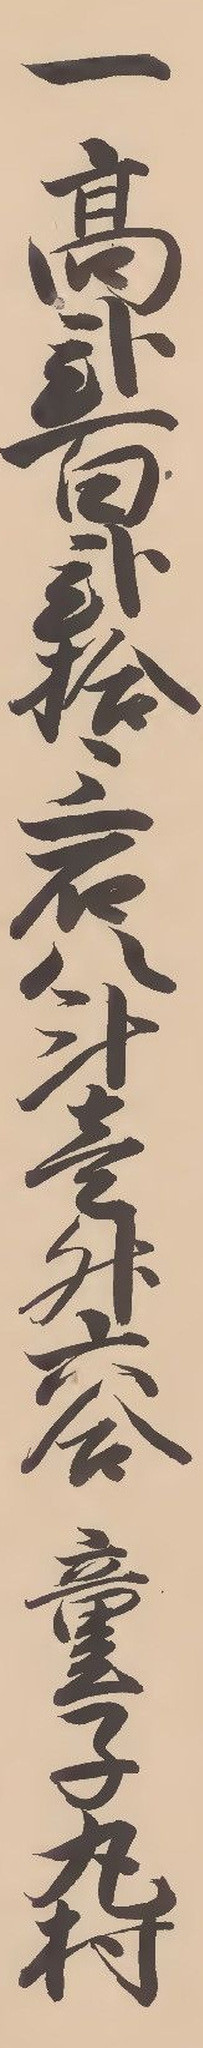一高弐百弐拾三石八斗壱升六合童子丸村
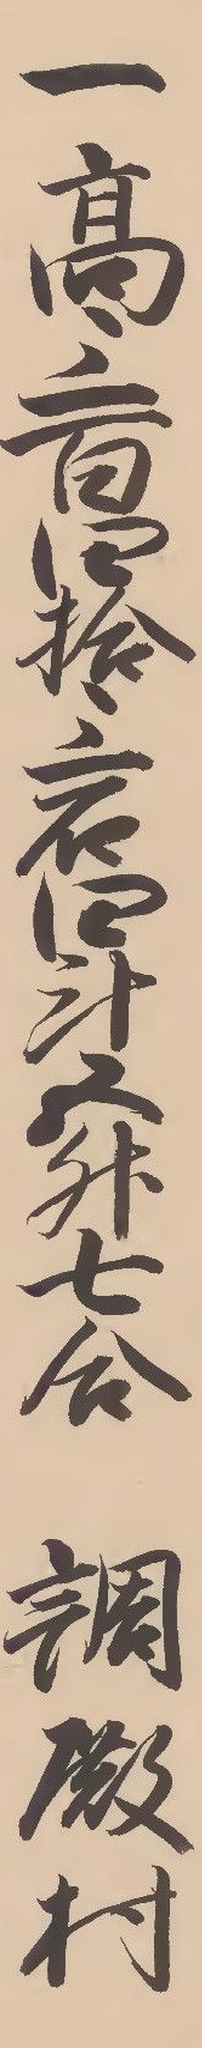一高三百四拾三石四斗五升七合調殿村

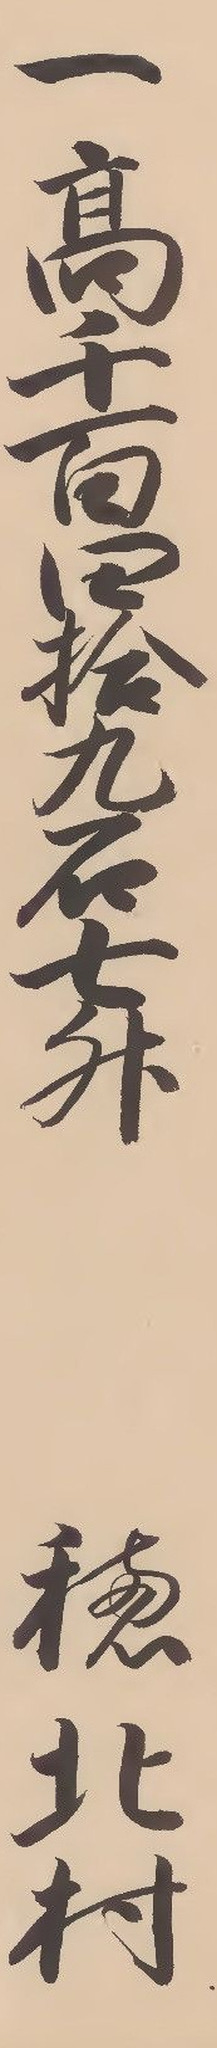一高千百四拾九石七升穂北村
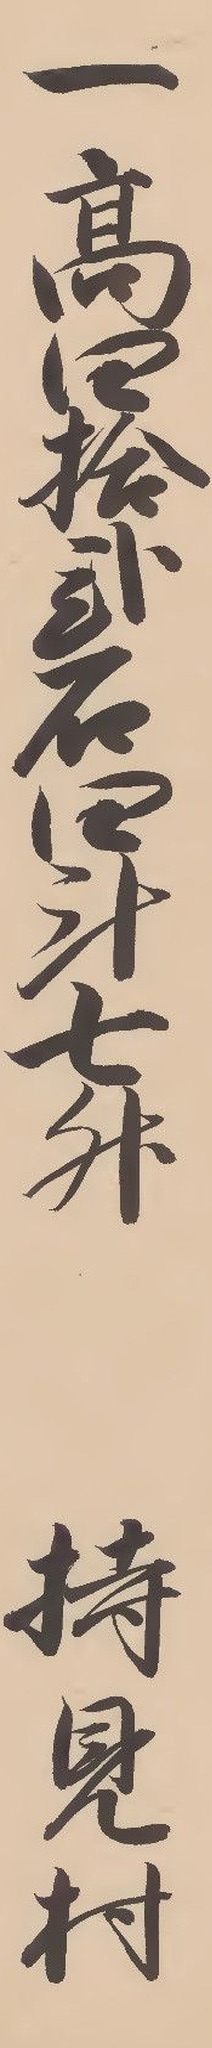一高四拾弐石四斗七升持見村
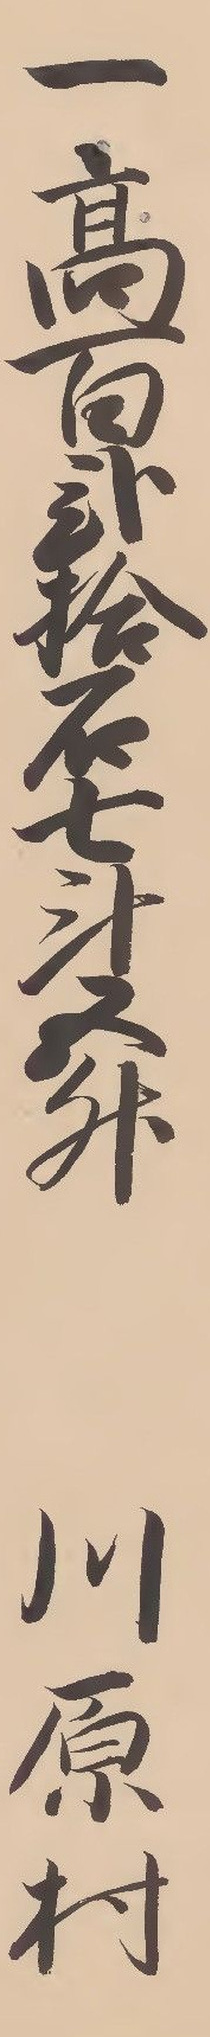一高百弐拾石七斗五升川原村
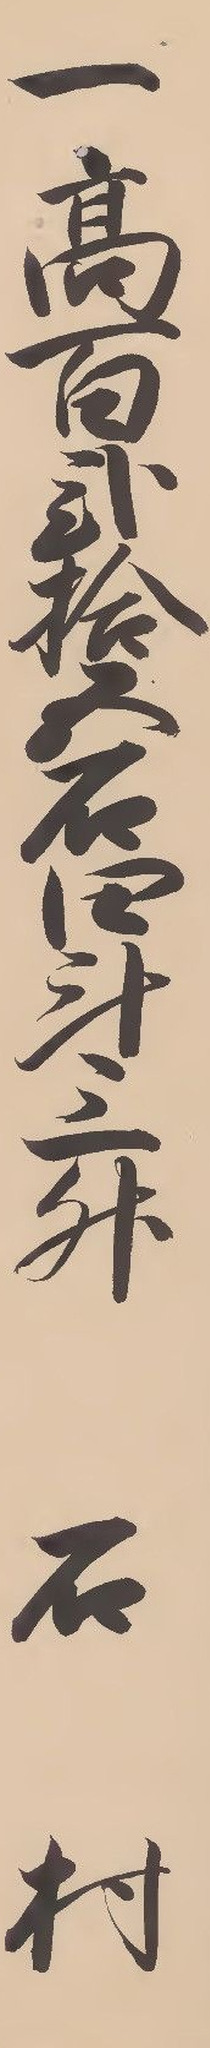一高百弐拾五石四斗三升石村
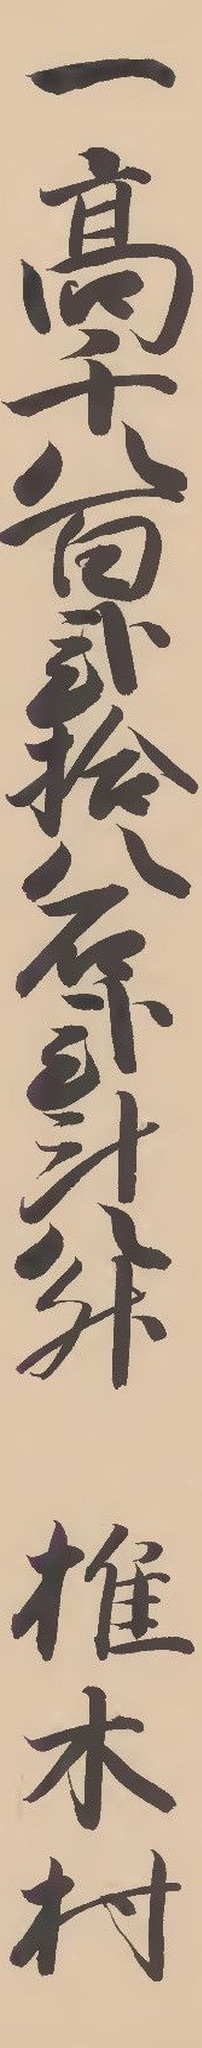一高千八百弐拾八石弐斗八升椎木村

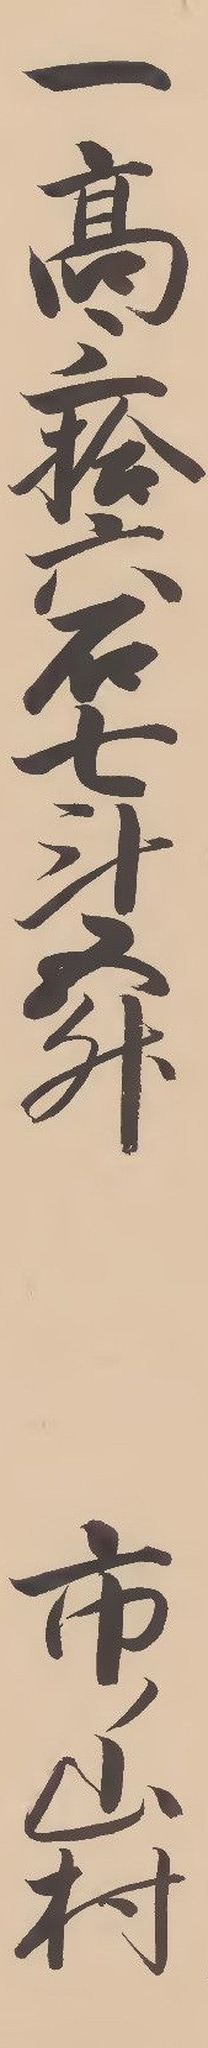一高三拾六石七斗五升市ノ山村
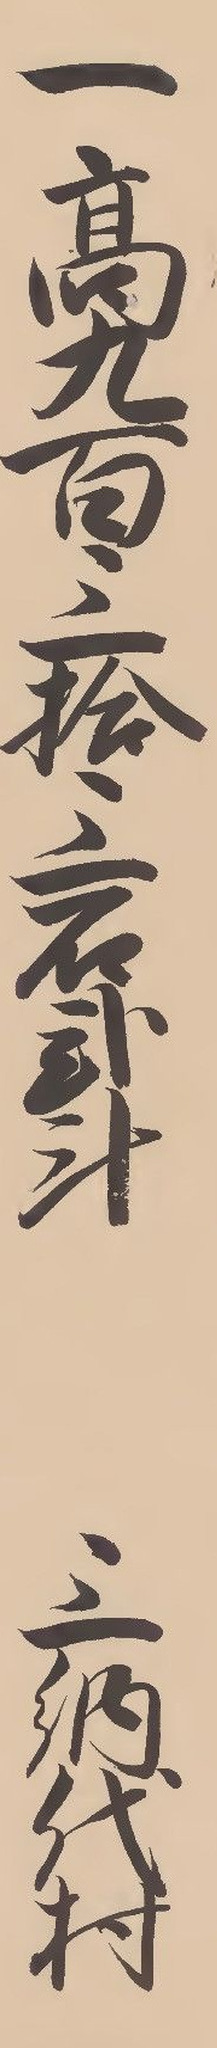一高九百三拾三石弐斗三納代村
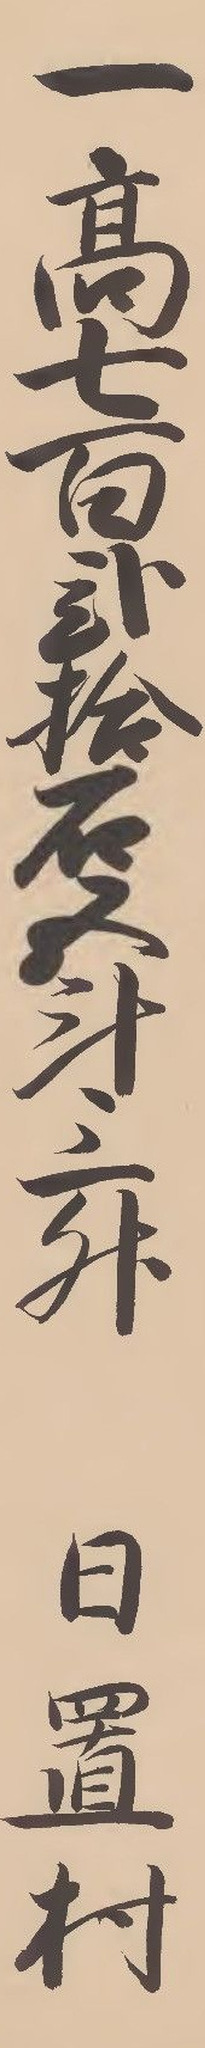一高七百弐拾石五斗三升日置村
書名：日向国郷帳
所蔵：国立公文書館 National Archives of Japan
